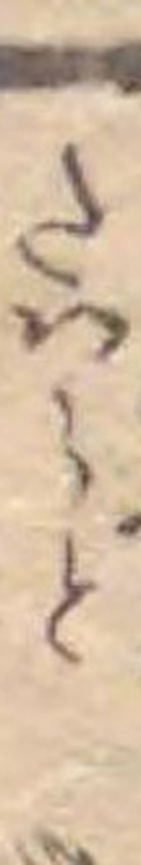たはらと
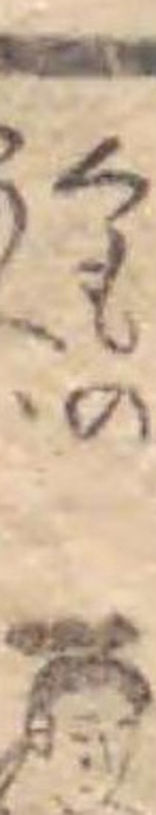くもの
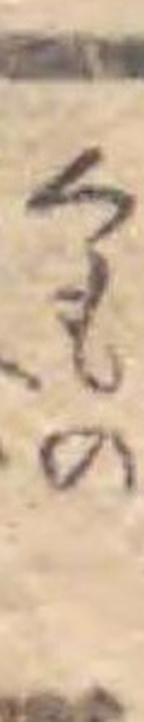くもの
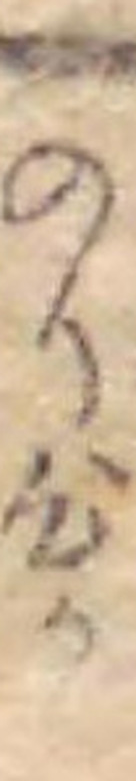のり心か
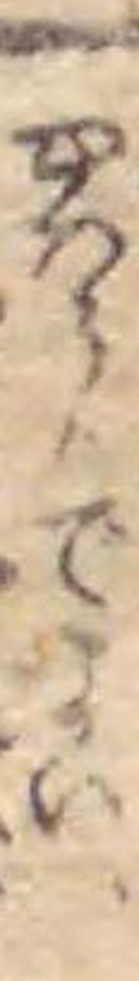やはらかでよい
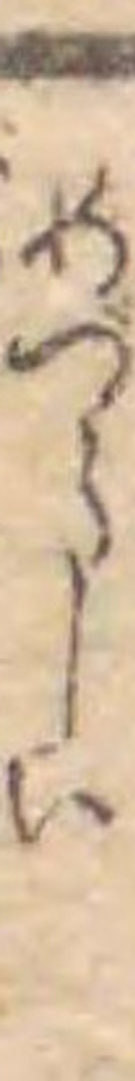めづらしい
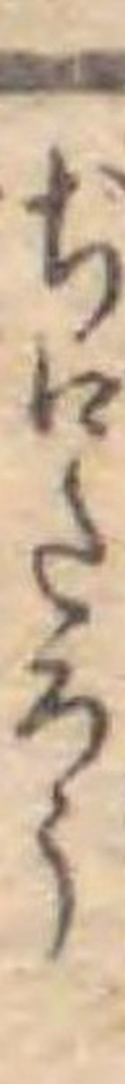ぢ口たろう
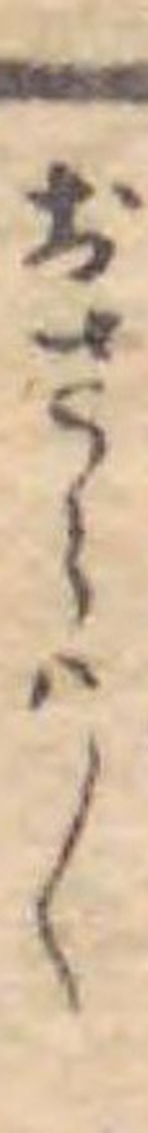おさらは〳〵
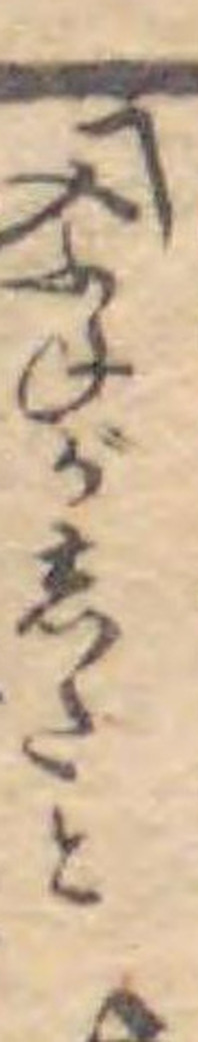〽入ふねがしたと
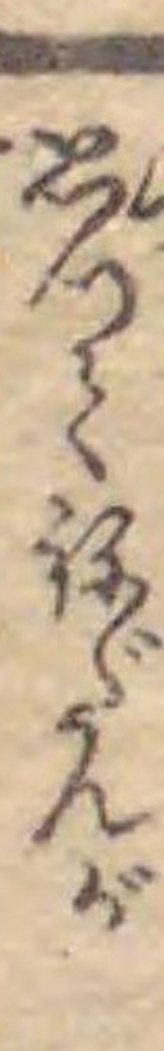思つてねだんが
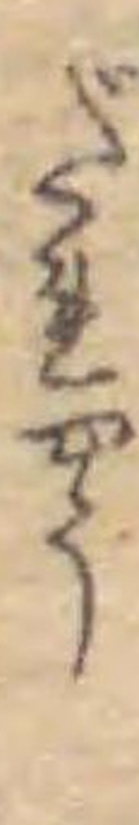だれやう

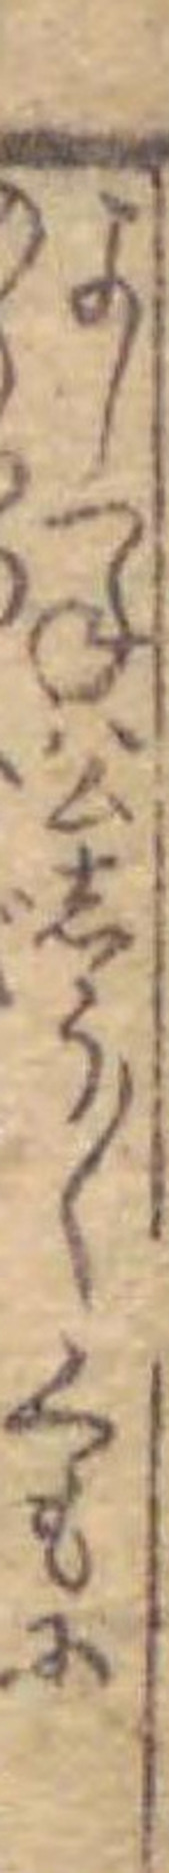よしつね公しう〳〵くもに
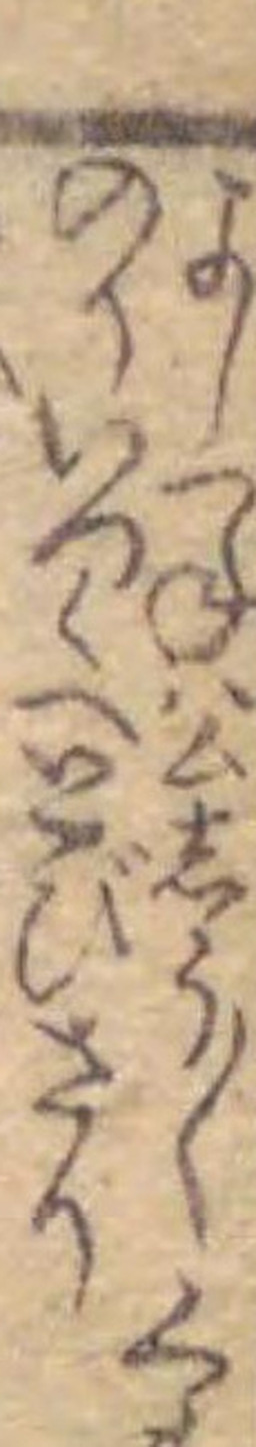のりいつくへとびさり
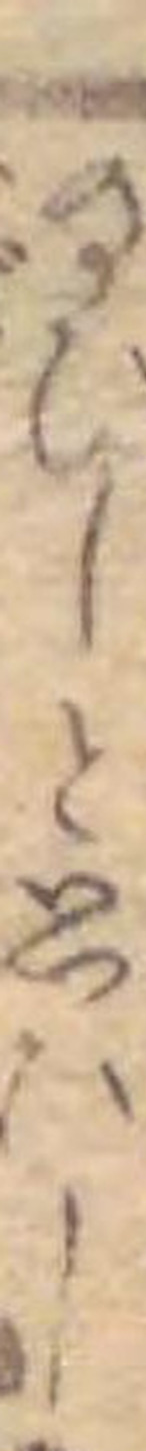給ひしと思ひしに
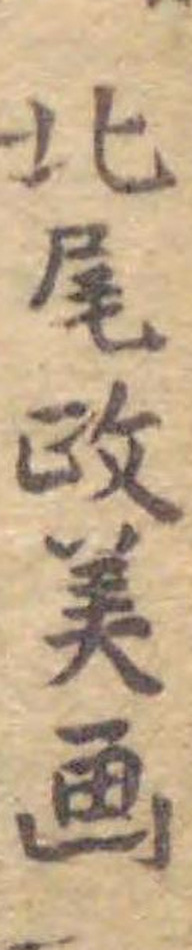北尾政美画
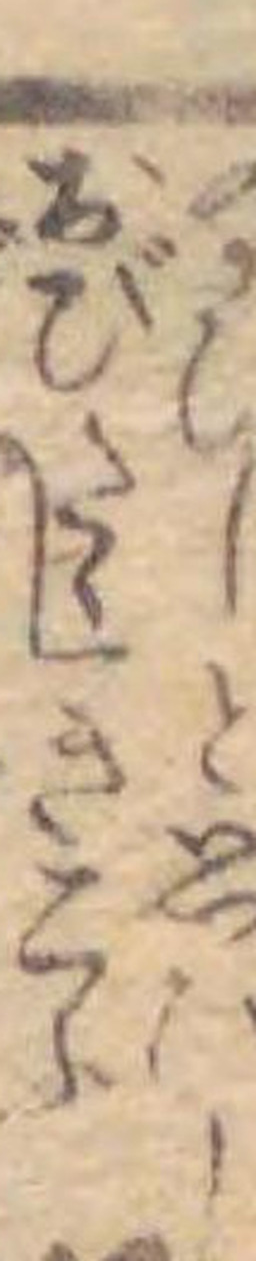おびたゝしきこふ
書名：悦贔負蝦夷押領 : 3巻
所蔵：国立国会図書館 National Diet Library, JAPAN
